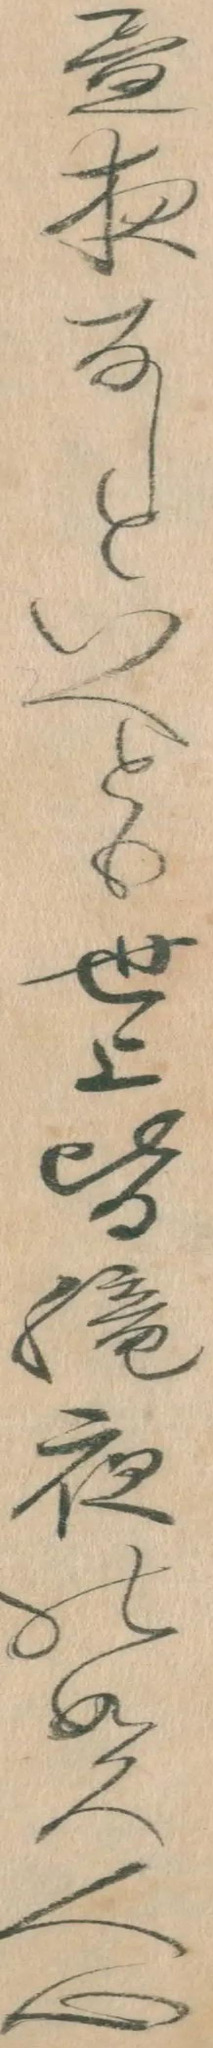昼夜なしといへとも世上皆朧夜の如く人心
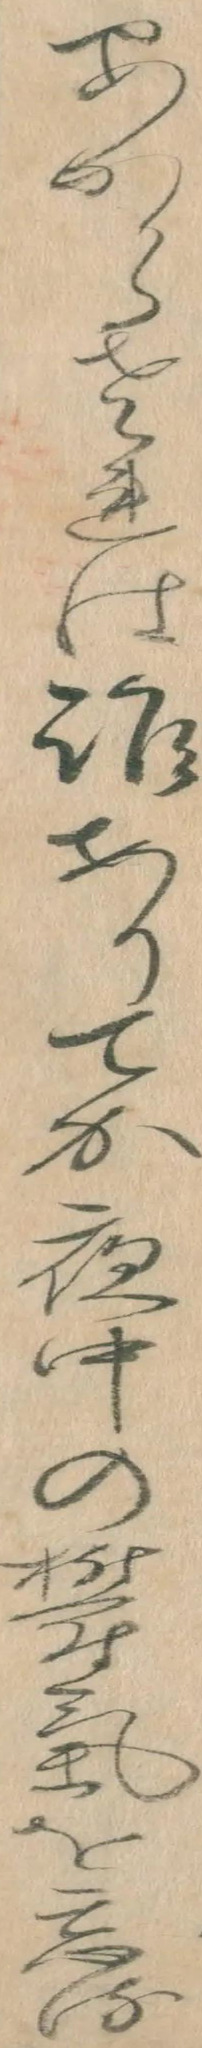安からされは誰ありてか夜中の欝気を忘る

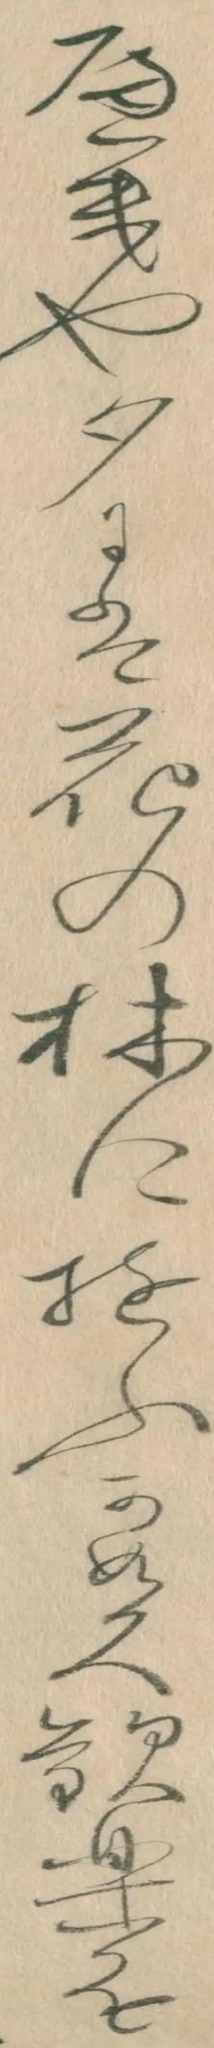へきや夕には花の林に遊ふか如く歓楽を
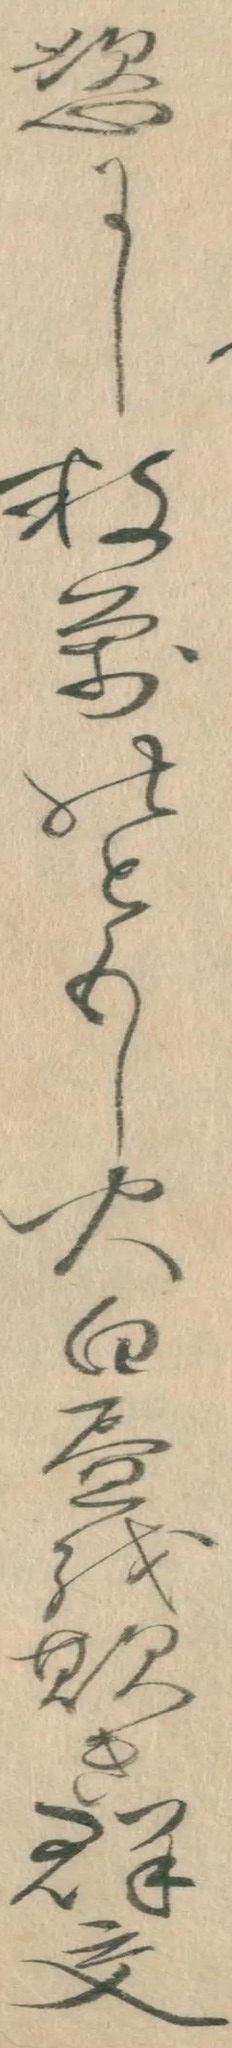恣にし数万のともし火白昼を欺き群交
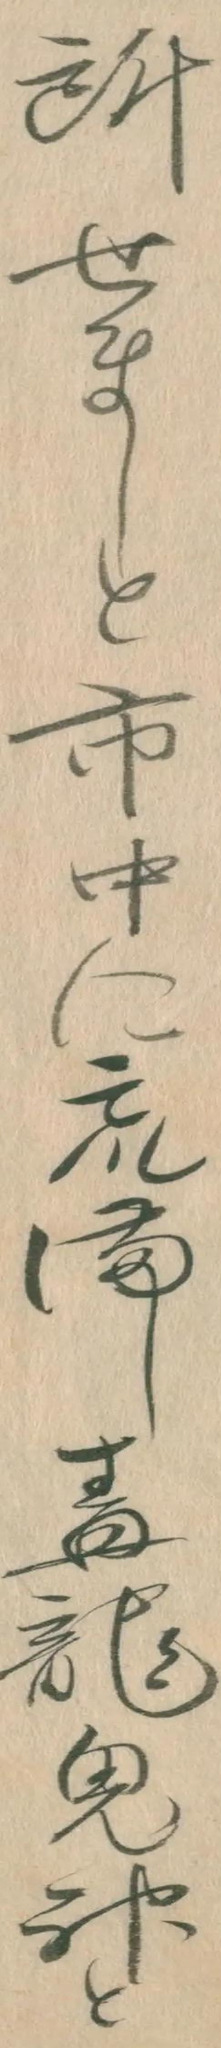所せましと市中に衆？満し毒龍鬼神と
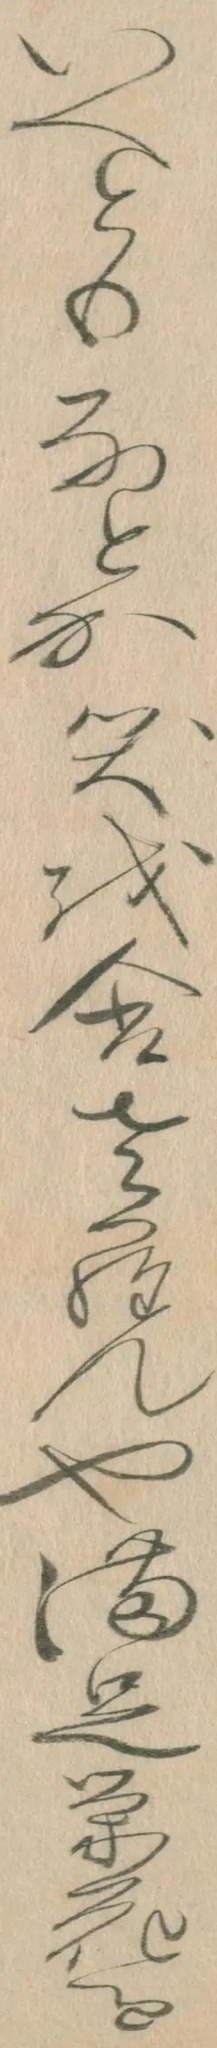いへともなとか笑を含さらんや満足栄花を
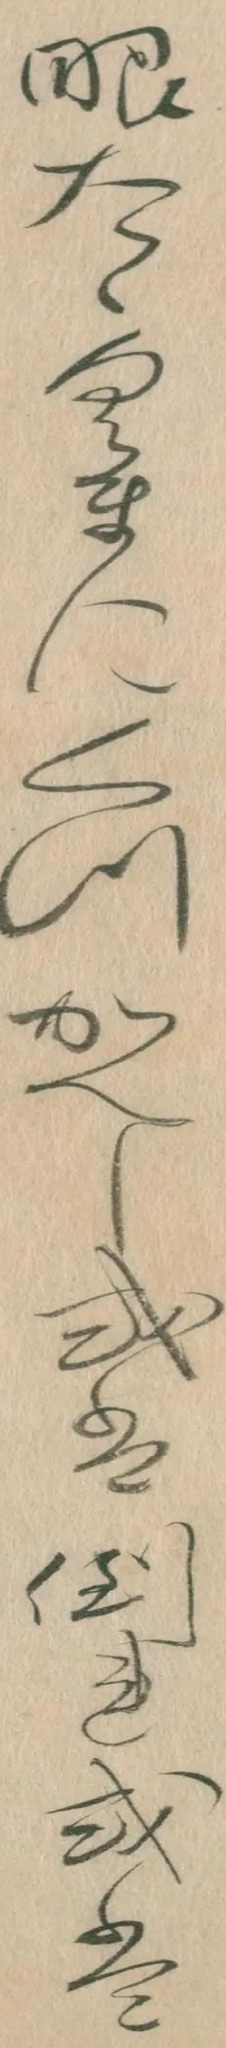眼たゝくまにくつかへし或は倒れ或は
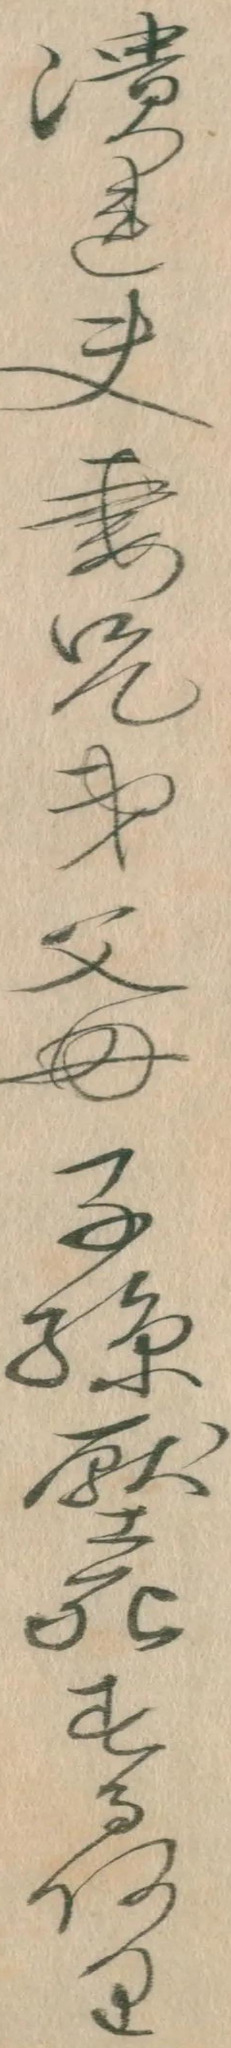潰れ夫妻兄弟父母子孫圧死するあり
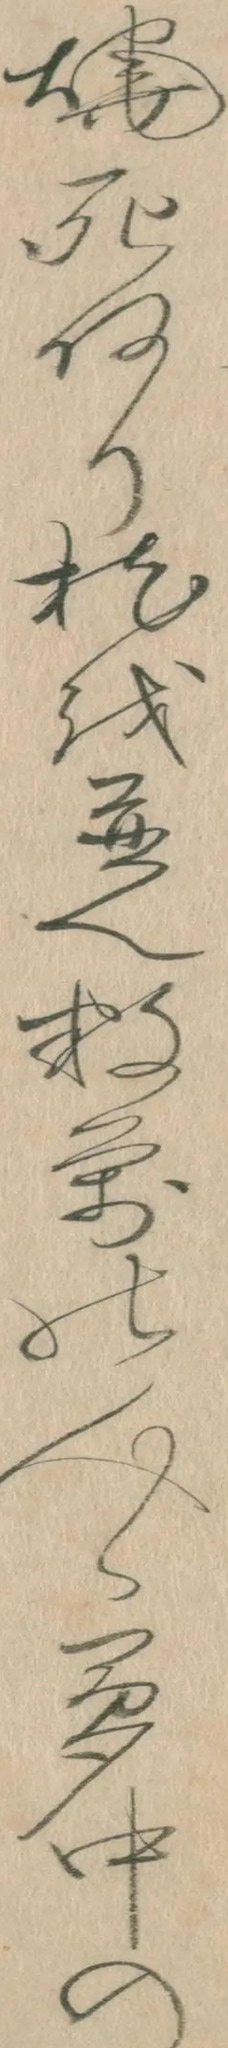焼死あり枕を並へ数万の人〳〵夢中の
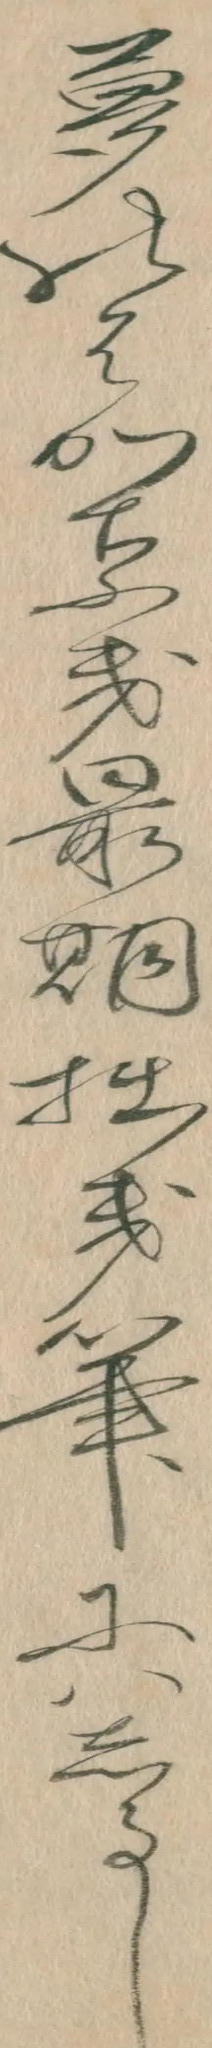夢のはかなき最期拙き筆にはしるし
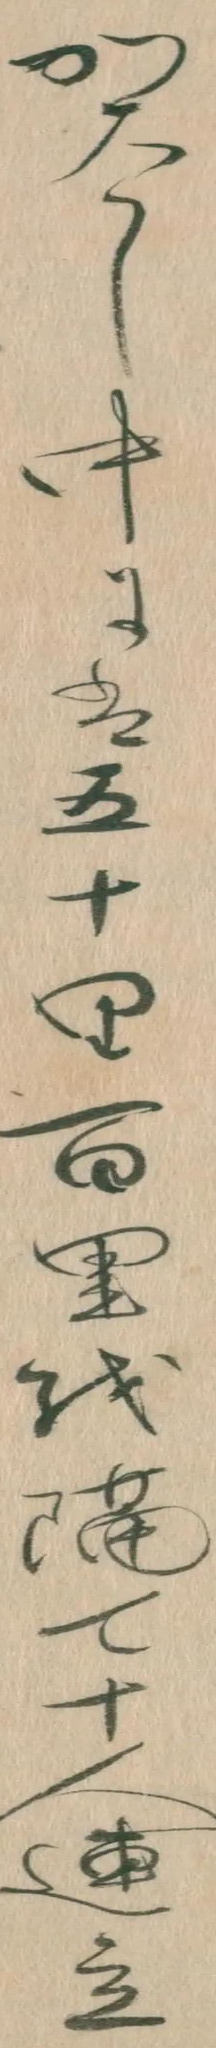かたし中には五十里百里を隔て十人連立
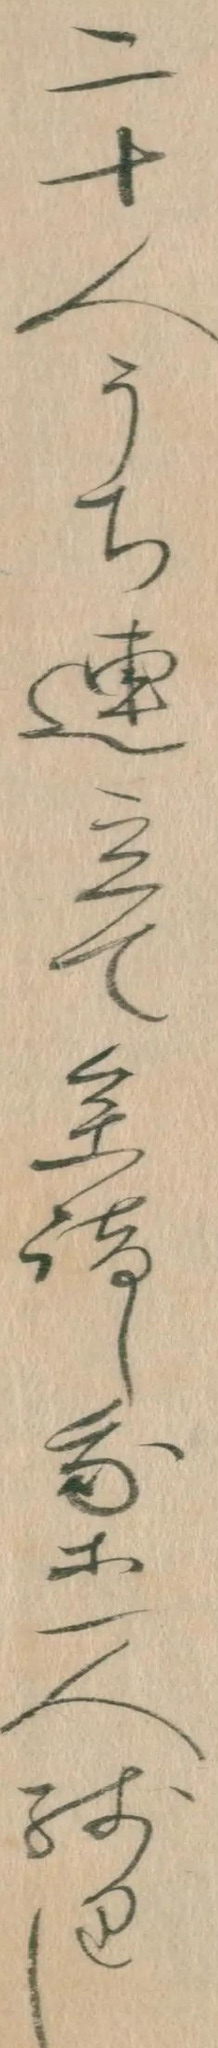二十人うち連立て参詣し我等一人残りし
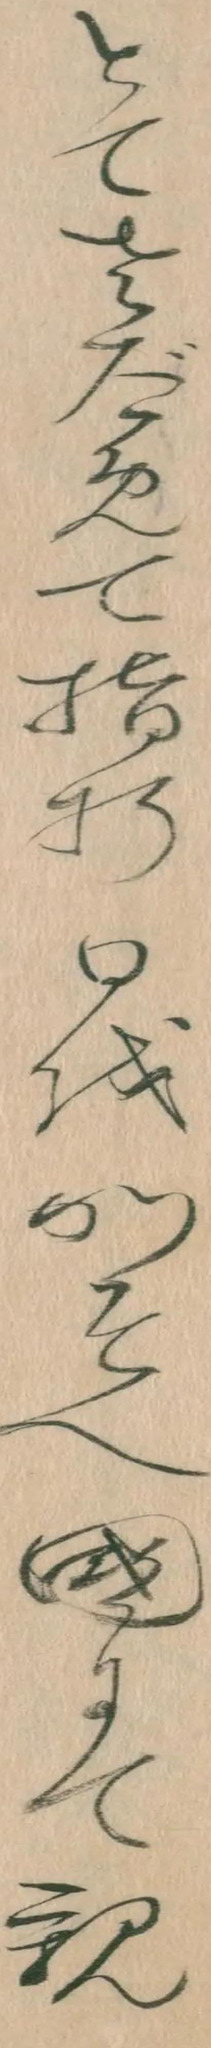とてさだめて指折日をかそへ国にて親
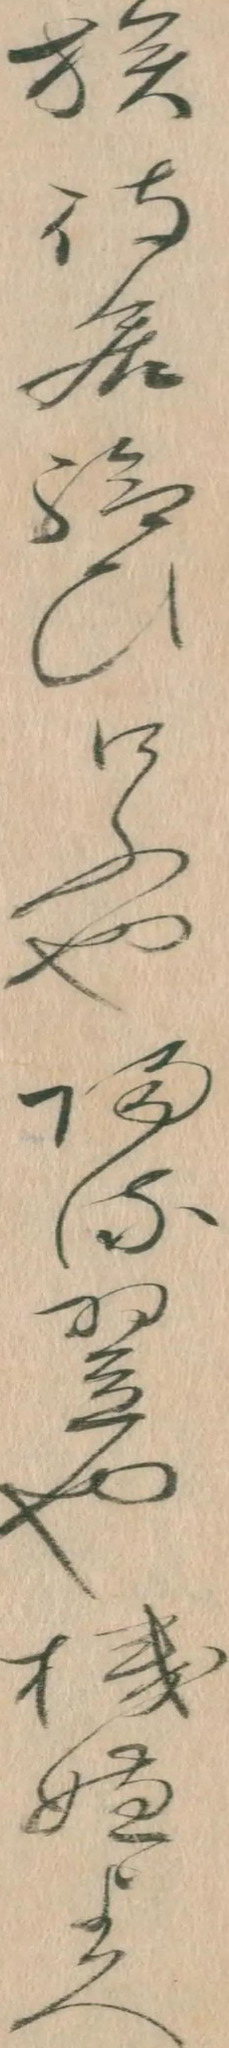族待居給ひけふや帰る翌や機嫌よく
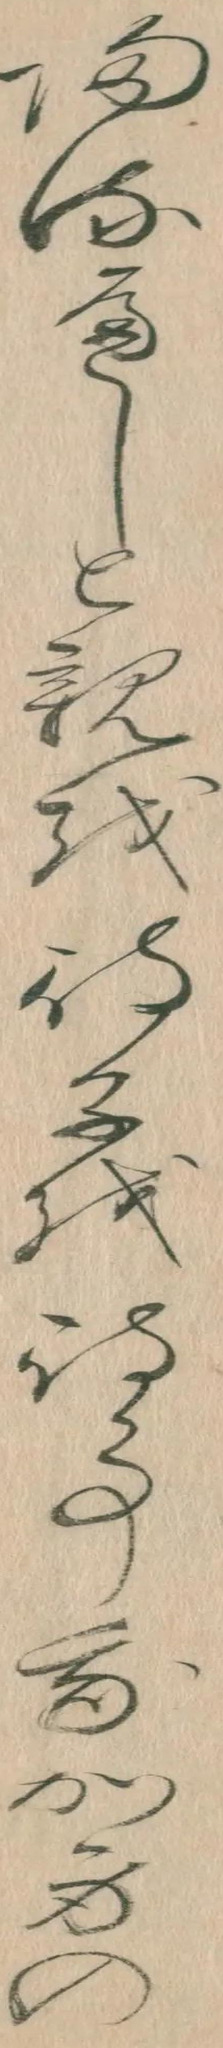帰るへしと親を待子を待事我か身の
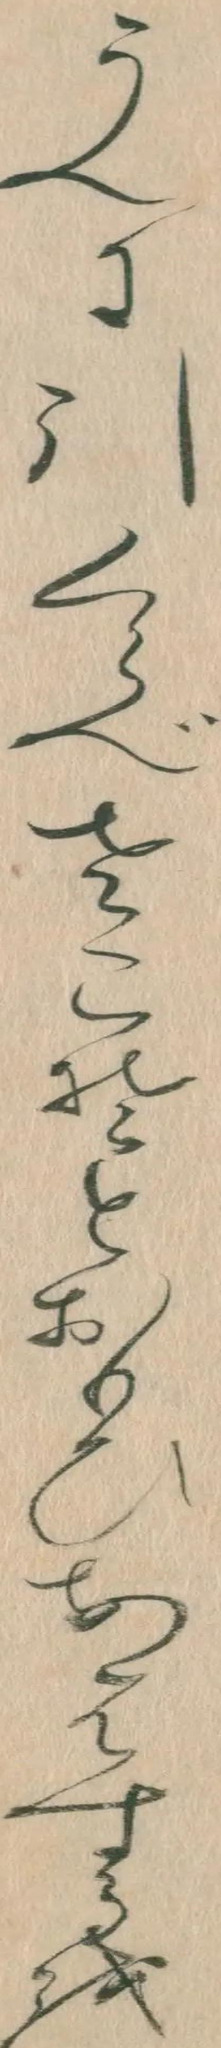うへに引くらべさこそとおもひあはするを
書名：俗語之種. [4]
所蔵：国立国会図書館 National Diet Library, JAPAN
